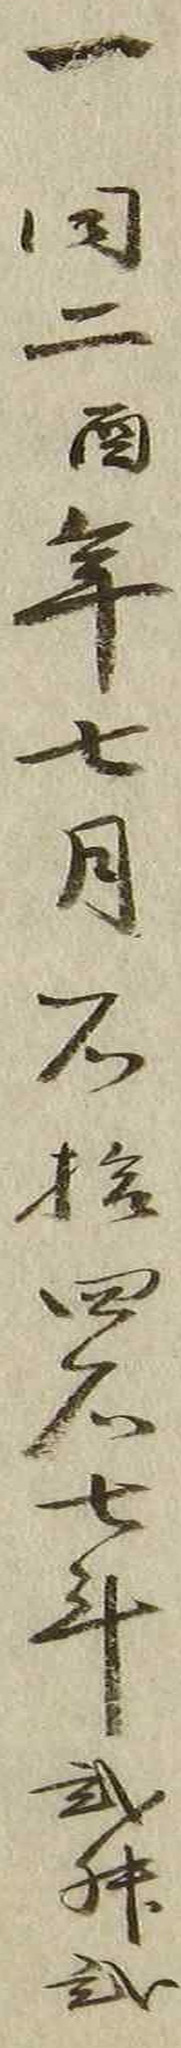一同二酉年七月石拾四石七斗弐升弐
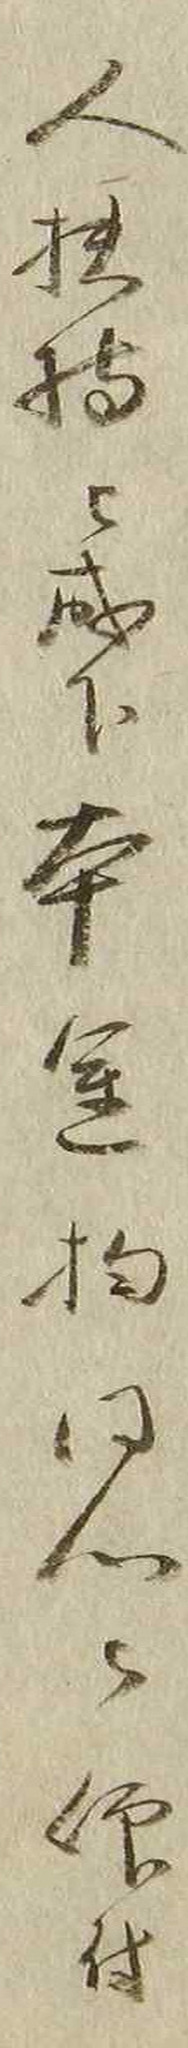人扶持被成下本途抱同心被仰付
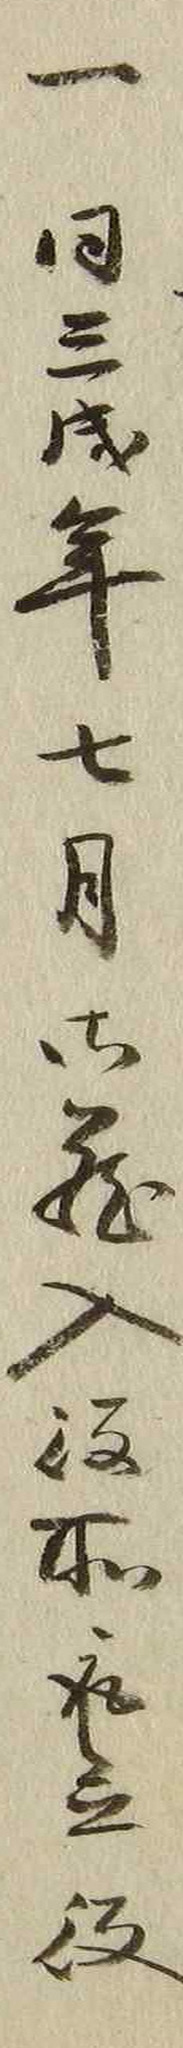一同三戌年七月御蔵入役所取立役
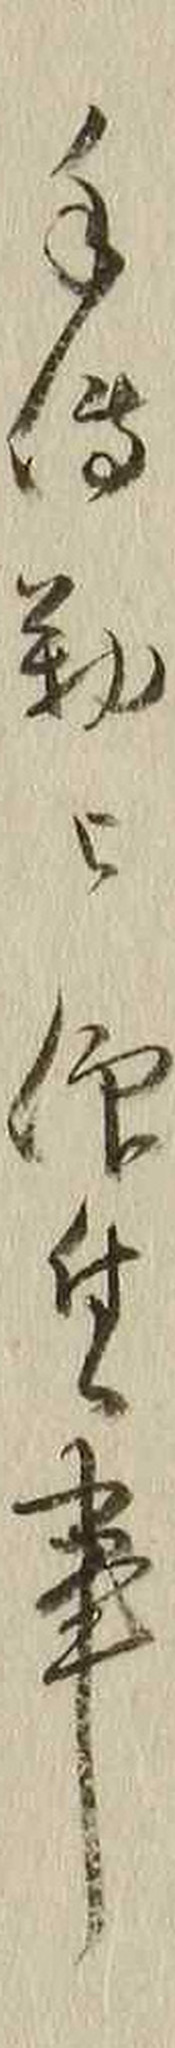手伝勤被仰付候事
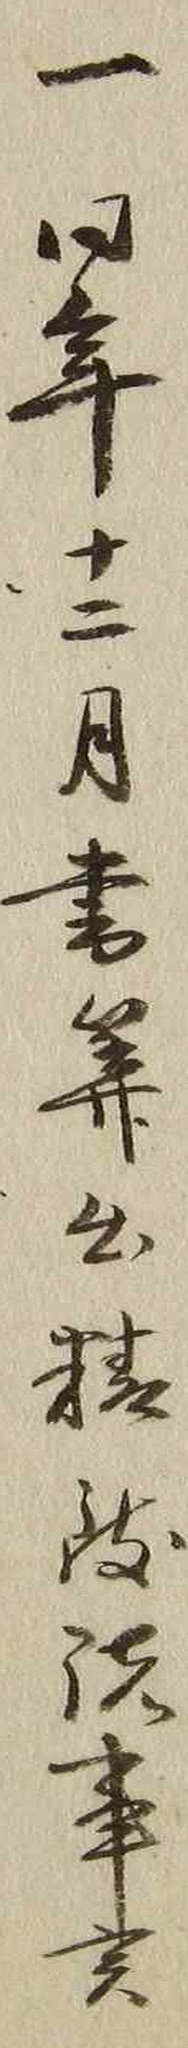一同年十二月書算出精致諸事実
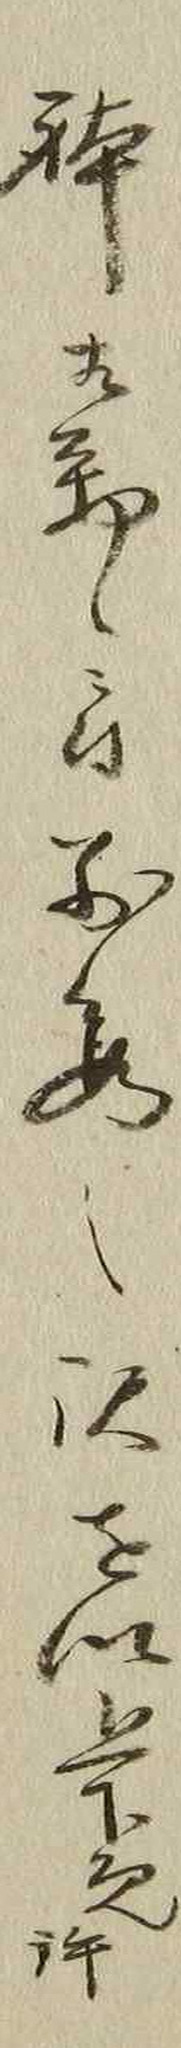躰相勤候ニ付別段之訳を以上下免許
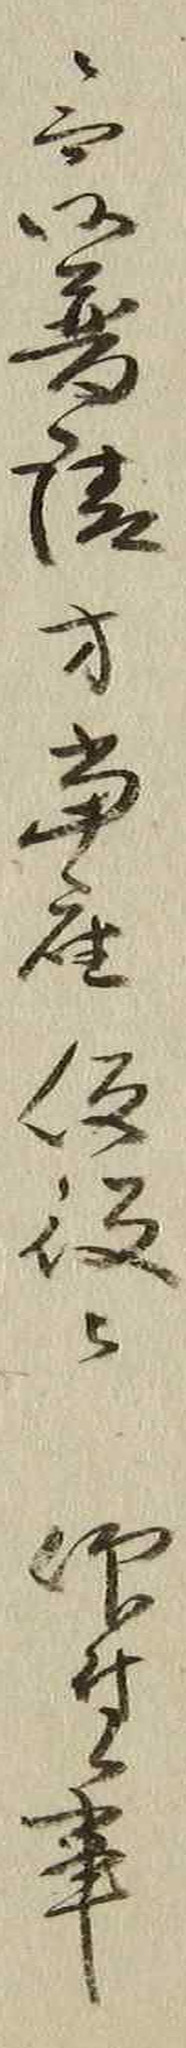ニ而御普請方当座仮役被仰付候事
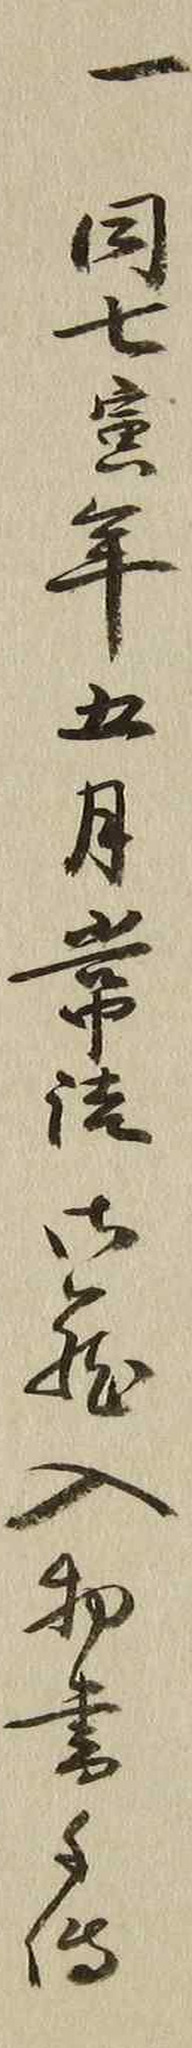一同七寅年五月常詰御蔵入物書手伝
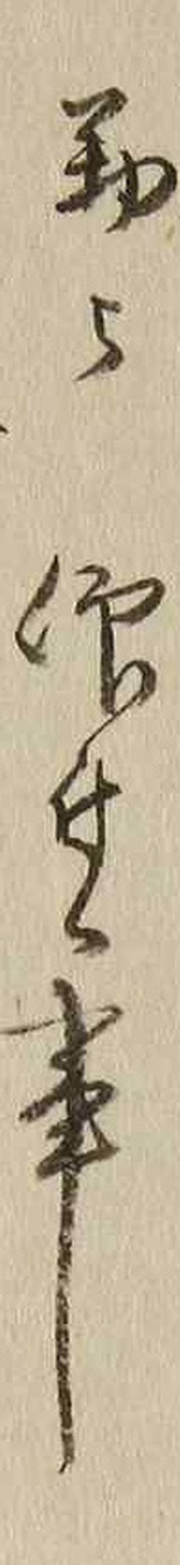勤被仰付候事
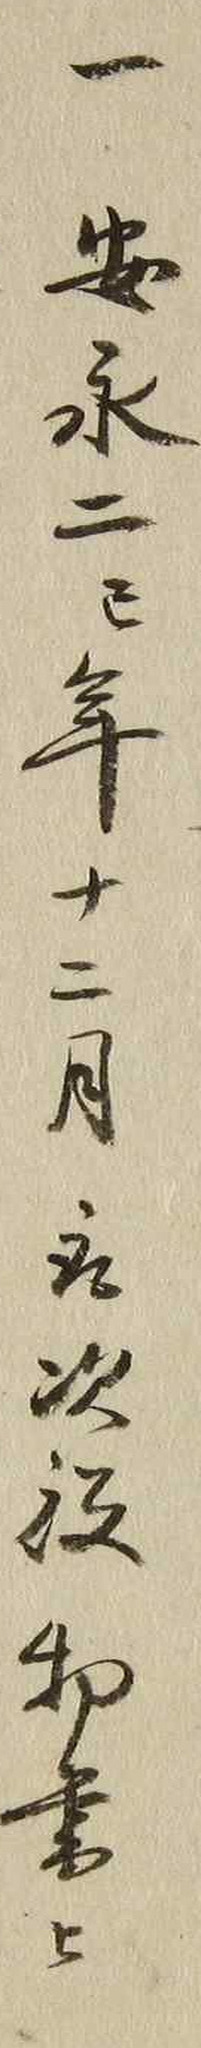一安永二巳年十二月取次役物書被
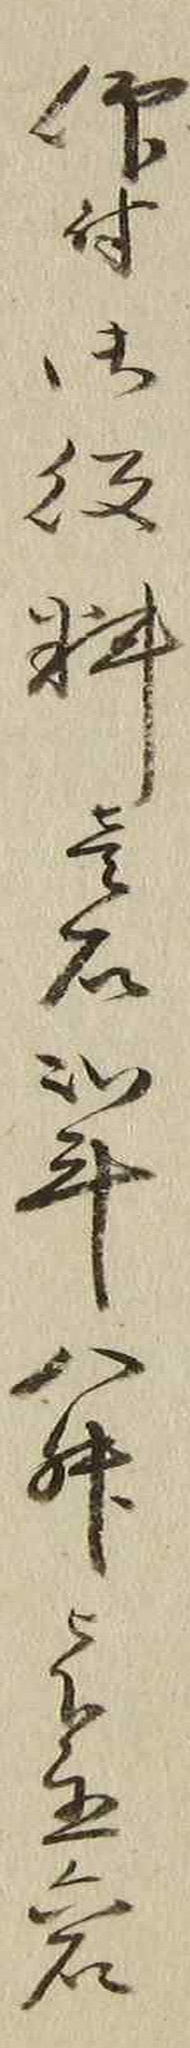仰付御役料壱石弐斗八升被下置六石
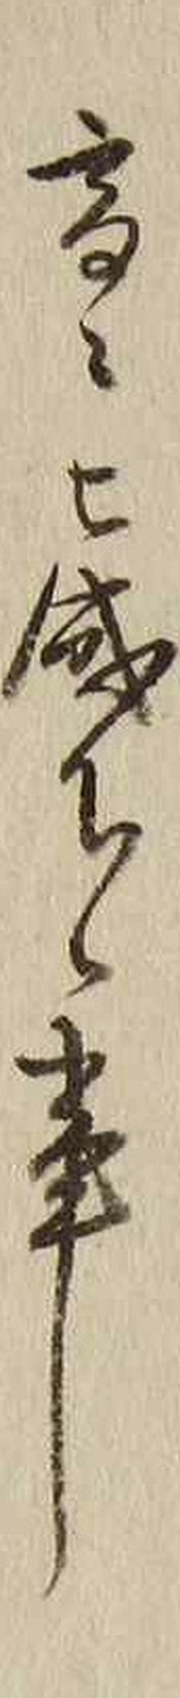高ニ被成下候事
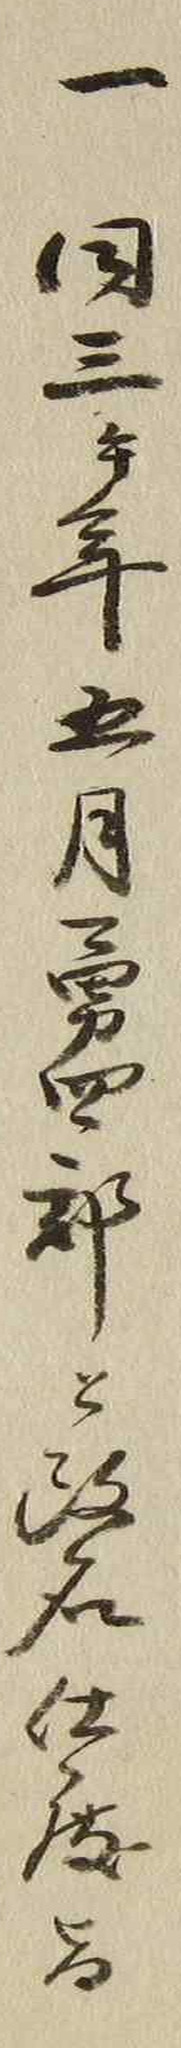一同三午年五月勇四郎と改名仕度旨
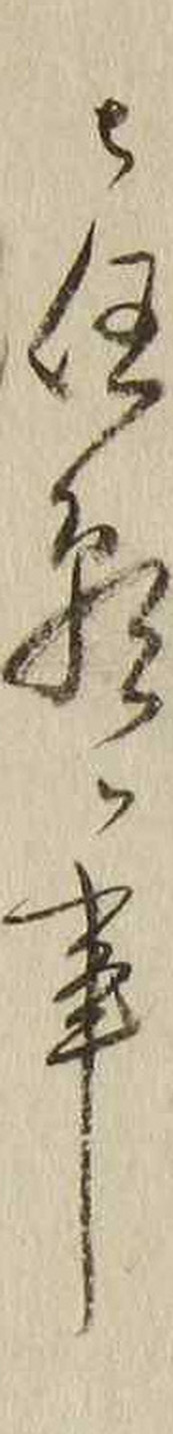被任願候事
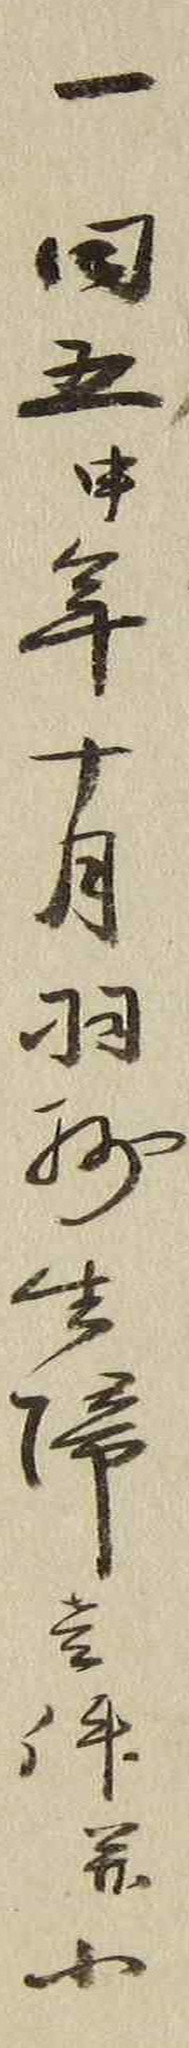一同五申年十月羽州先帰壱件并小
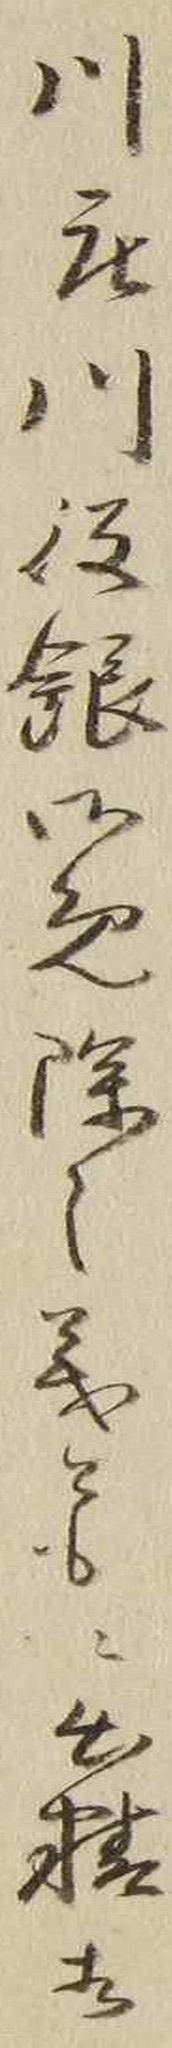川庄川役銀御免除之義ともニ出精相
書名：諸士系譜　巻之236　ふ之部4
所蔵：会津若松市立会津図書館
